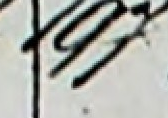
197
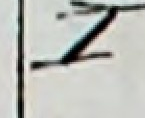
I
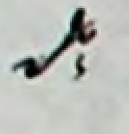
do
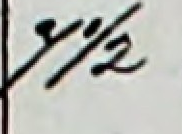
7 ½
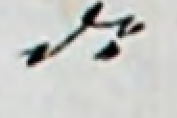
do
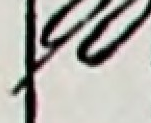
90
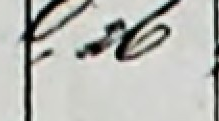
0,16
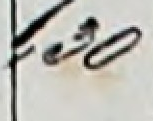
1,30
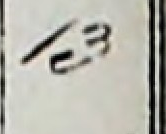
13
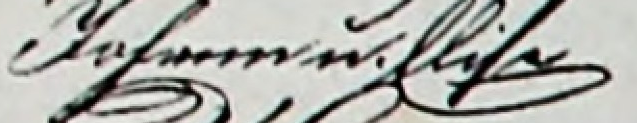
Johann u. Elise
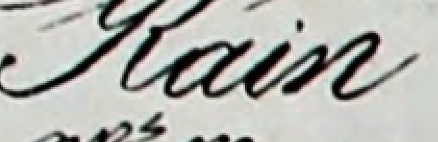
Kain
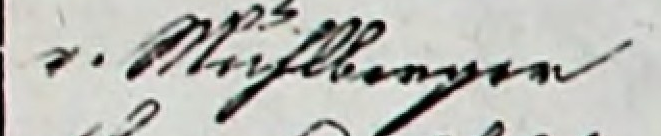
v. Mühlberger
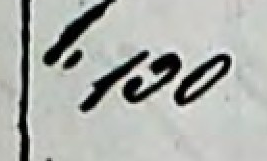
1,130
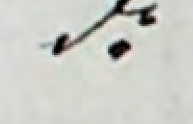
do
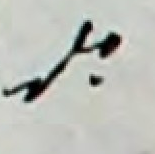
do
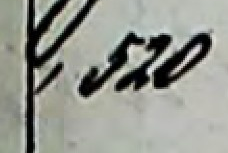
0,520
